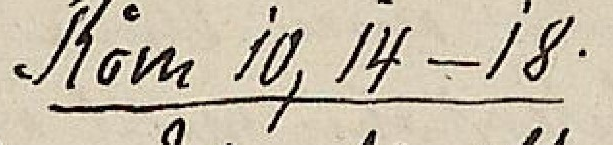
Röm 10,14-18.
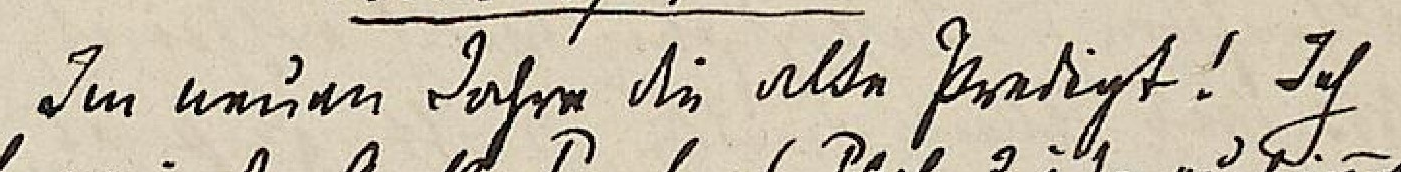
In neuen Jahre die alte Predigt! Ich
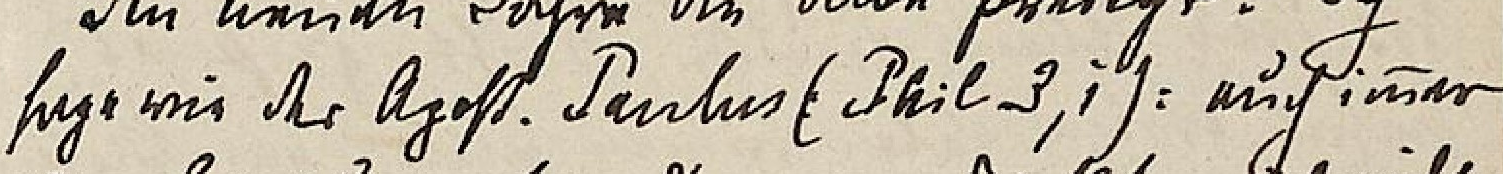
sage wie der Apost. Paulus (Phil. 3,1): euch immer
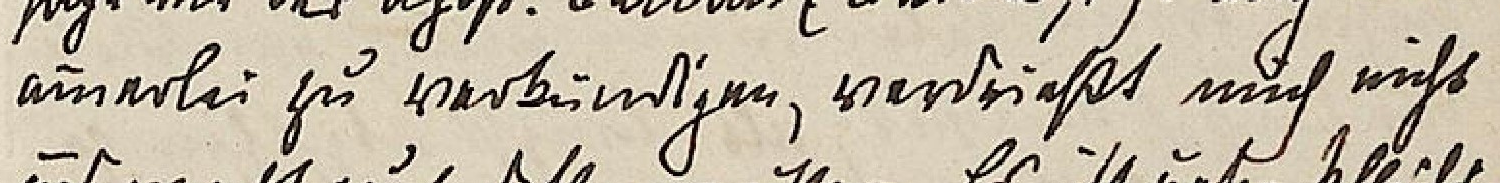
einerlei zu verkündigen, verdrießt mich nicht
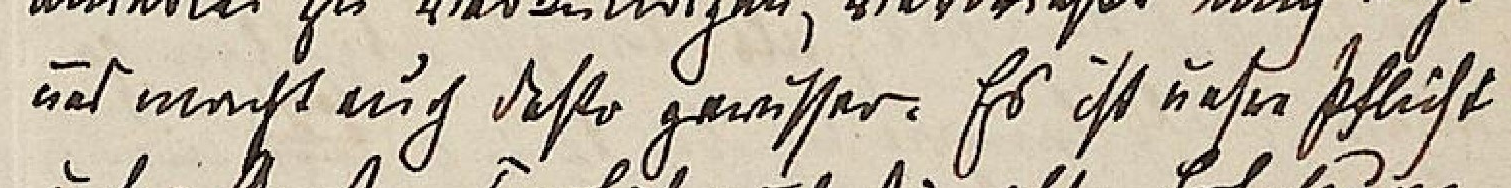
und macht auch desto gewisser. Es ist unsre Pflicht
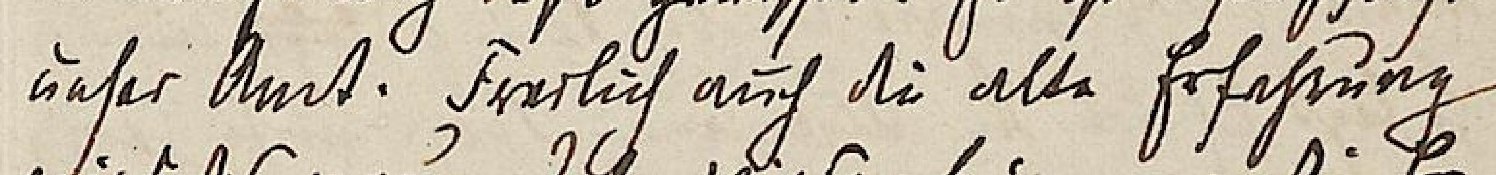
unser Amt. Freilich auch die alle Erfahrung
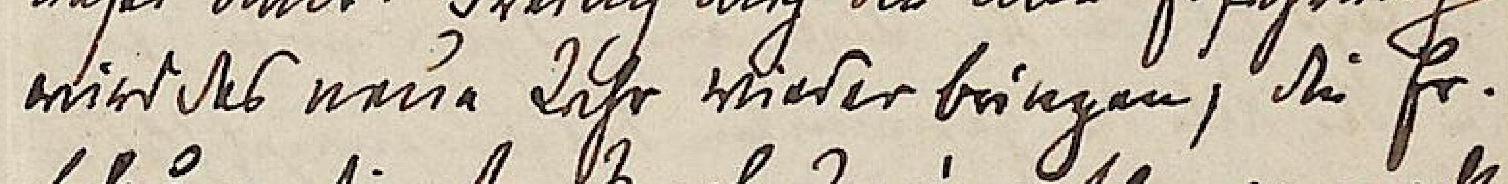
wird das neue Jahr wieder bringen, die Er¬
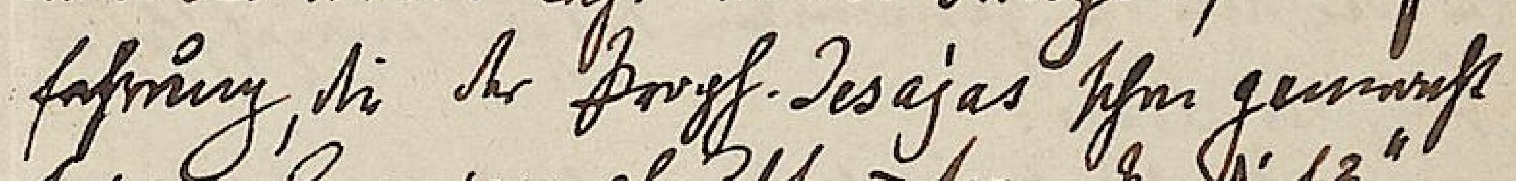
fahrung, die der Proph. Jesaja schon gemacht
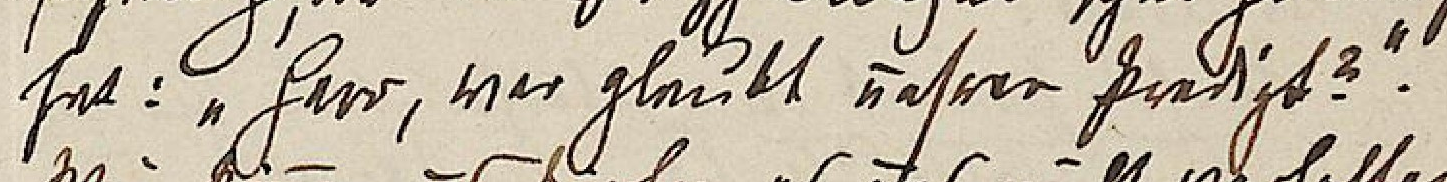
hat: "Herr, wer glaubt unsrer Predigt?"
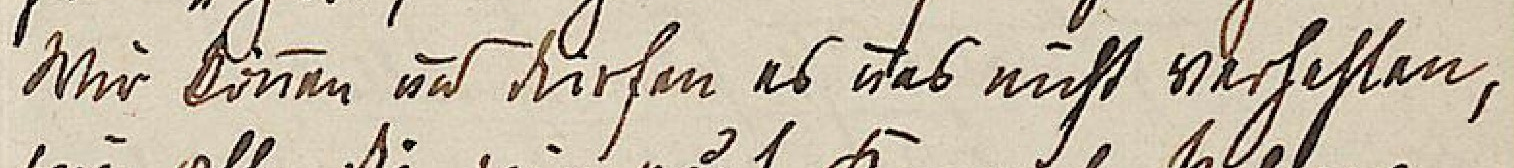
Wir können und dürfen es uns nicht verhehlen,
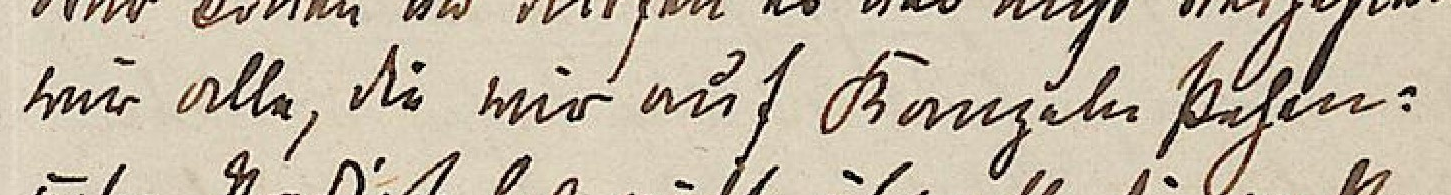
wir alle, die wir auf Kanzeln stehen:
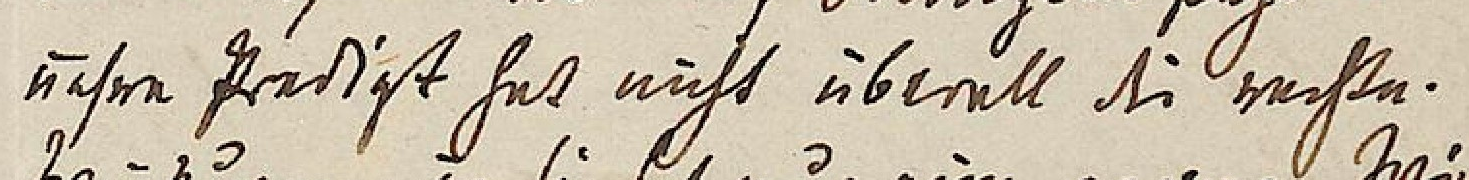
unsre Predigt hat nicht überall die rechte
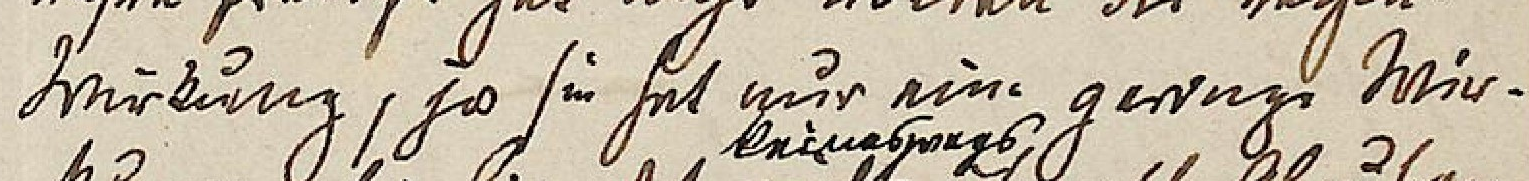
Wirkung, ja sie hat nur eine geringe Wir¬
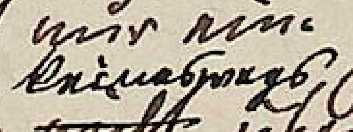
keineswegs
